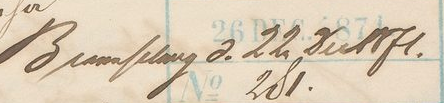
Braunschweig d. 22. Dec.
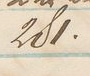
1871.
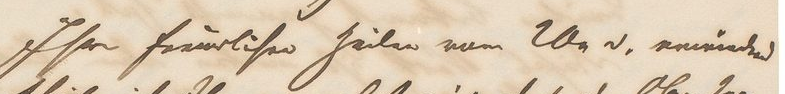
Ihre freundlichen Zeilen vom 20n d. erwiedernd
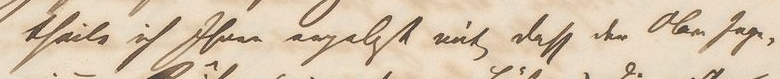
theile ich Ihnen ergebenst mit, dass der Ober Inge-
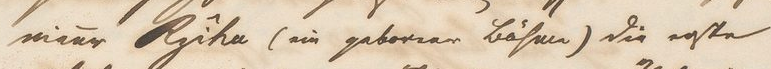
nieur Rziha (ein geborner Böhme) die erste
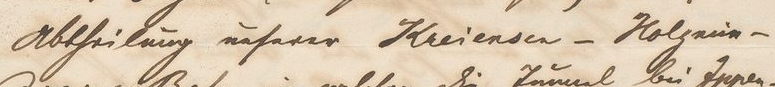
Abtheilung unserer Kreienser–Holzmin-
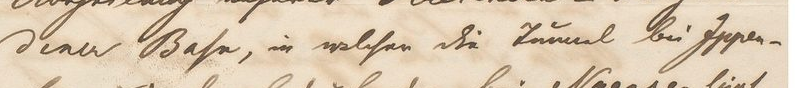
dener Bahn, in welcher die Tunnel bei Ippen-
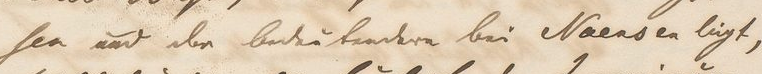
sen und der bedeutendere bei Naensen liegt,
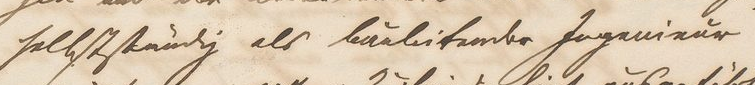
selbstständig als bauleitender Ingenieur
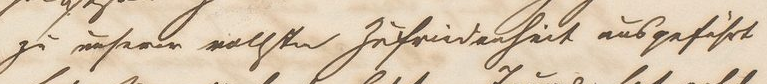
zu unserer vollsten Zufriedenheit ausgeführt
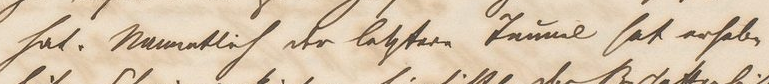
hat. Namentlich der letztere Tunnel hat erheb-
